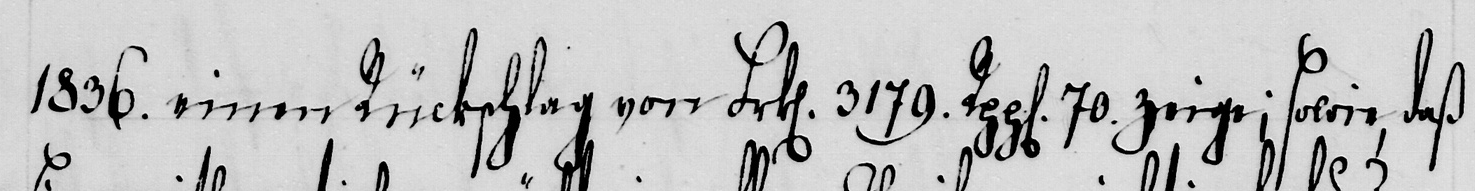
1836. einen Rückschlag von Frk[en]. 3179. Rpp[en]. 70. zeige;
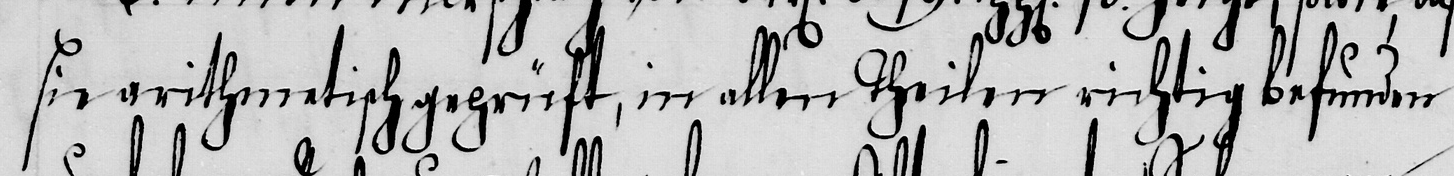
sie arithmetisch geprüft, in allen Theilen richtig befunden
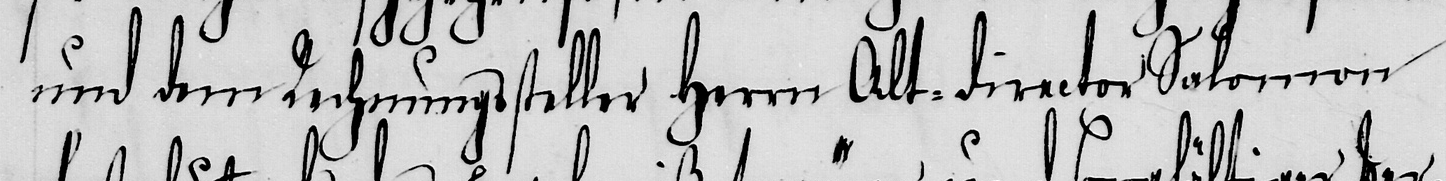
und dem Rechnungssteller Herrn Alt-director Salomon
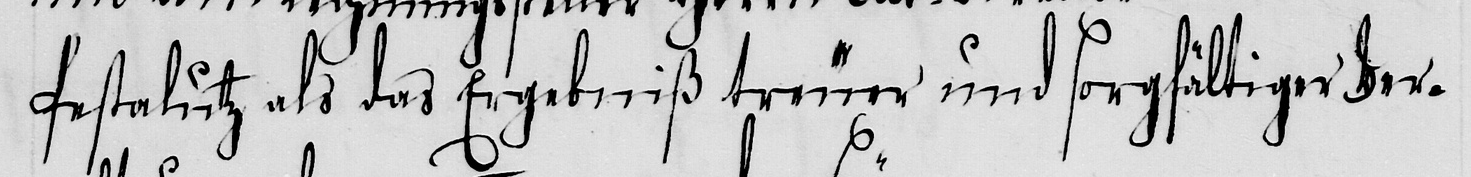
Pestalutz als das Ergebniß treuer und sorgfältiger Ver¬
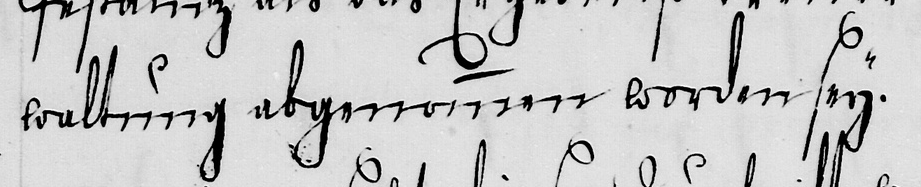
waltung abgenommen worden sey.
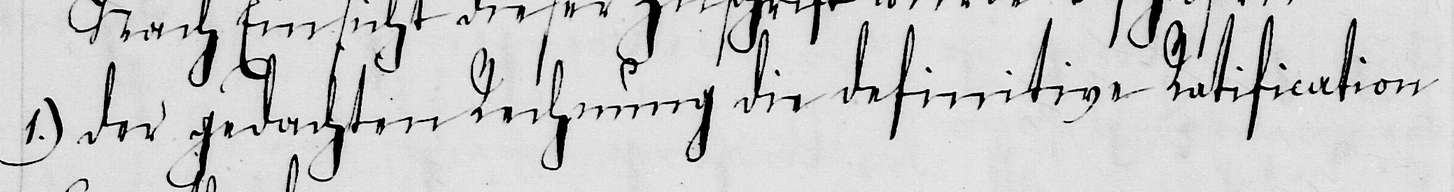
1.) der gedachten Rechnung die definitive Ratification
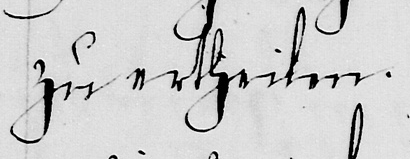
zu ertheilen.
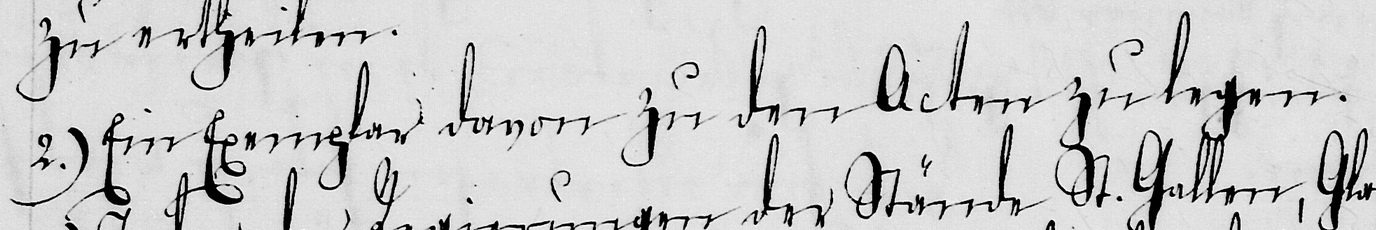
2.) Ein Exemplar davon zu den Acten zu legen.
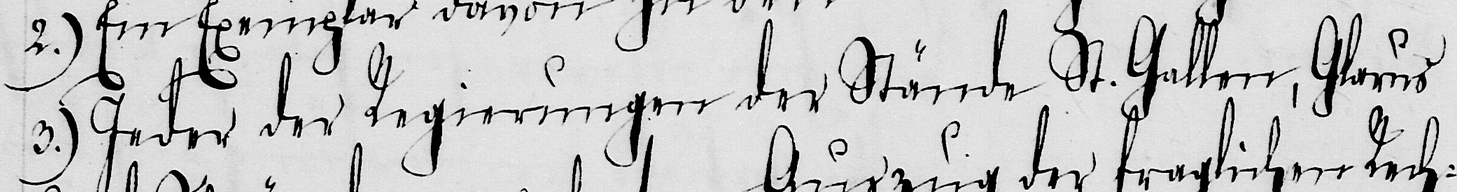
3.) Jeder der Regierungen der Stände St. Gallen, Glarus
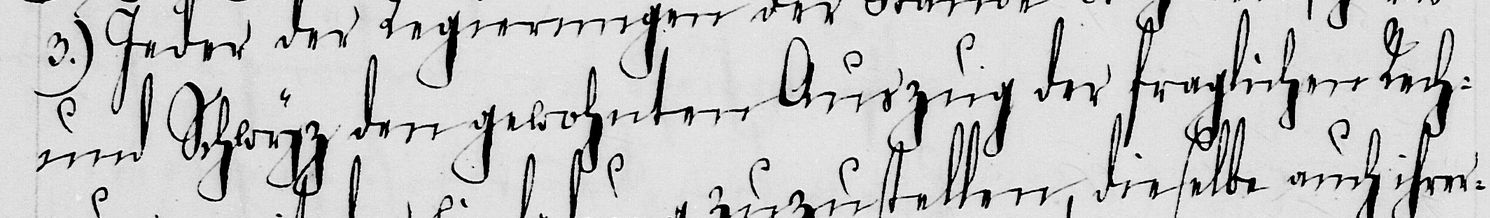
und Schwyz den gewohnten Auszug der fraglichen Rech¬
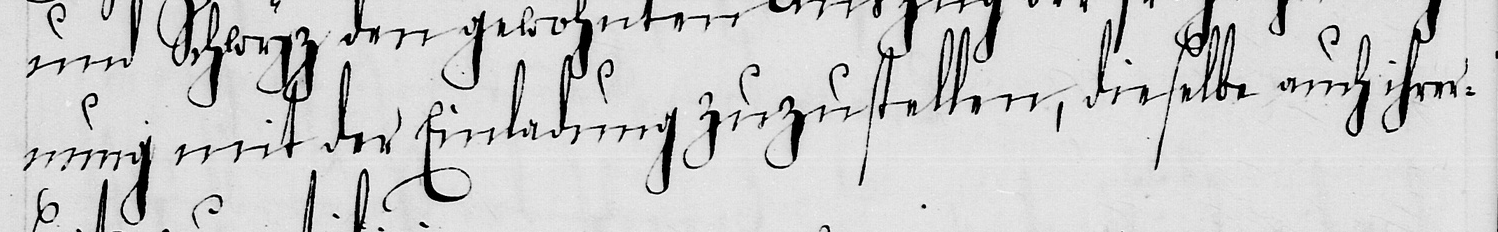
nung mit der Einladung zuzustellen, dieselbe auch ihre¬
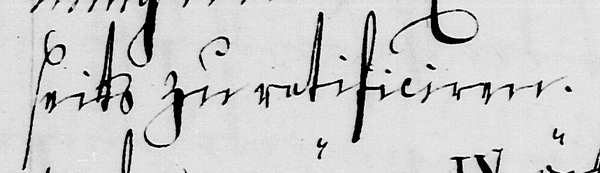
rseits zu ratificiren.
